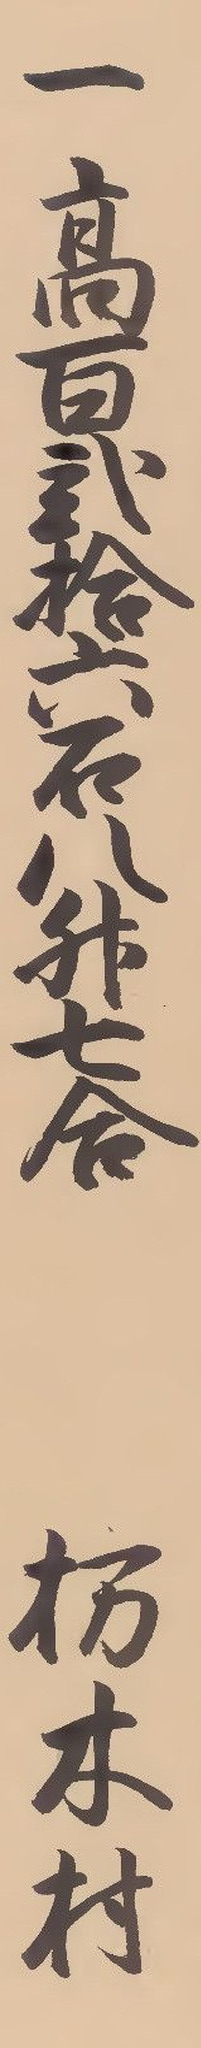一髙百弐拾六石八升七合杤木村
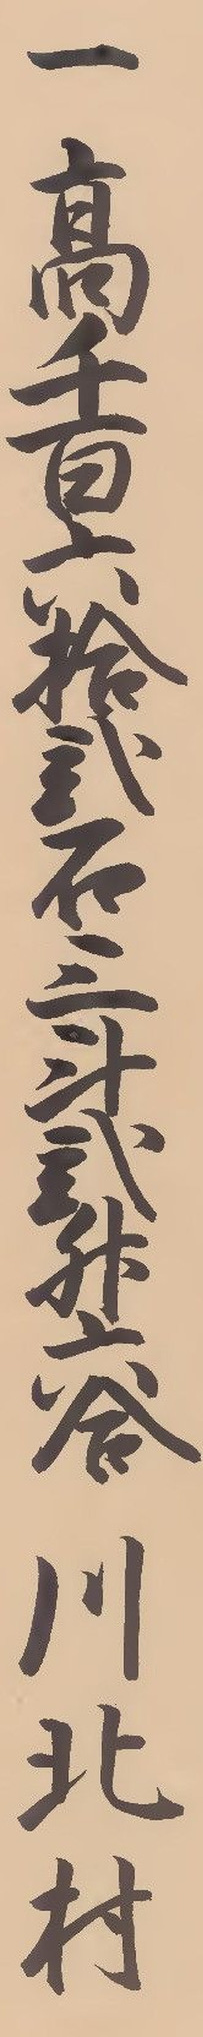一髙千百六拾弐石三斗弐升六合川北村

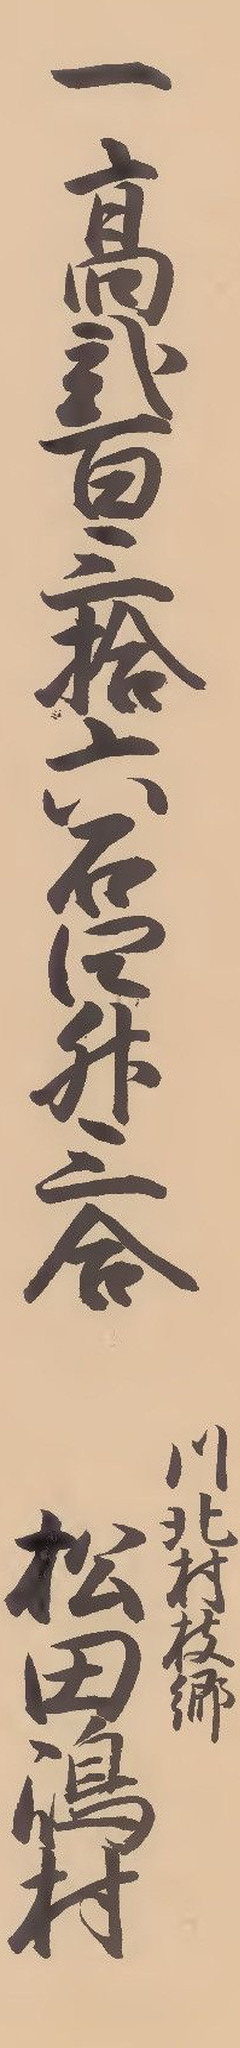一髙弐百三拾六石四升三合松田嶋村
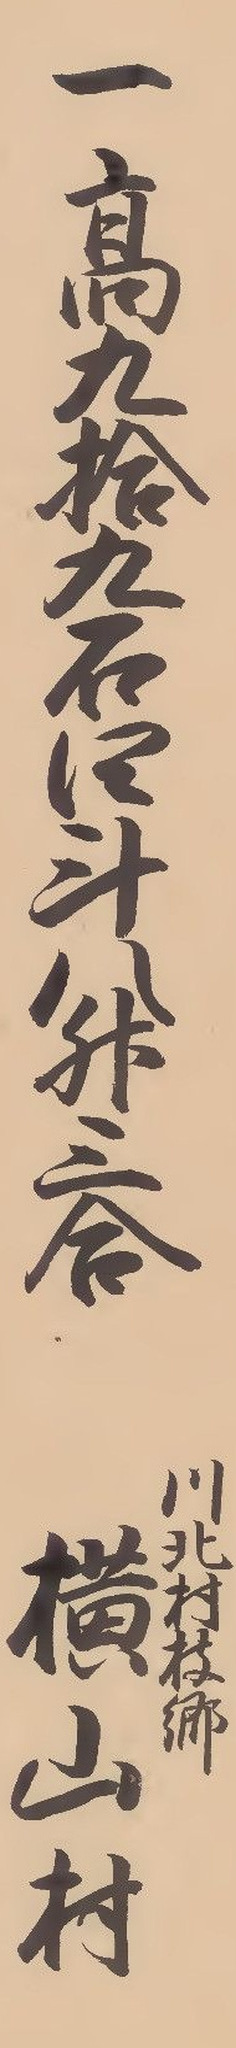一髙九拾九石四斗八升三合横山村
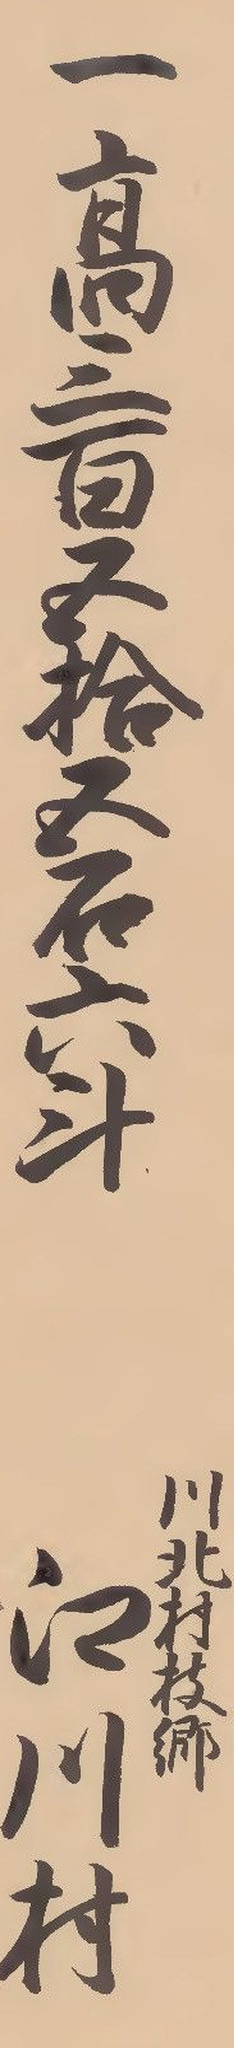一髙三百五拾五石六斗江川村
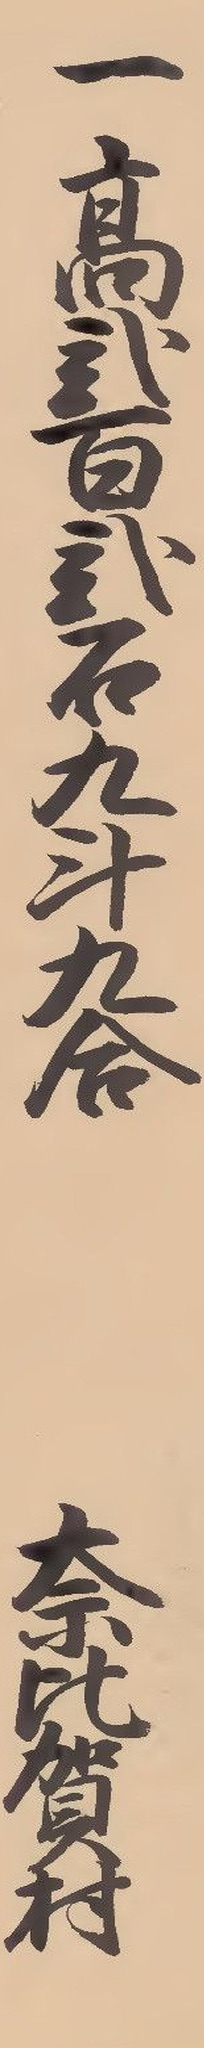一髙弐百弐石九斗九合奈比賀村
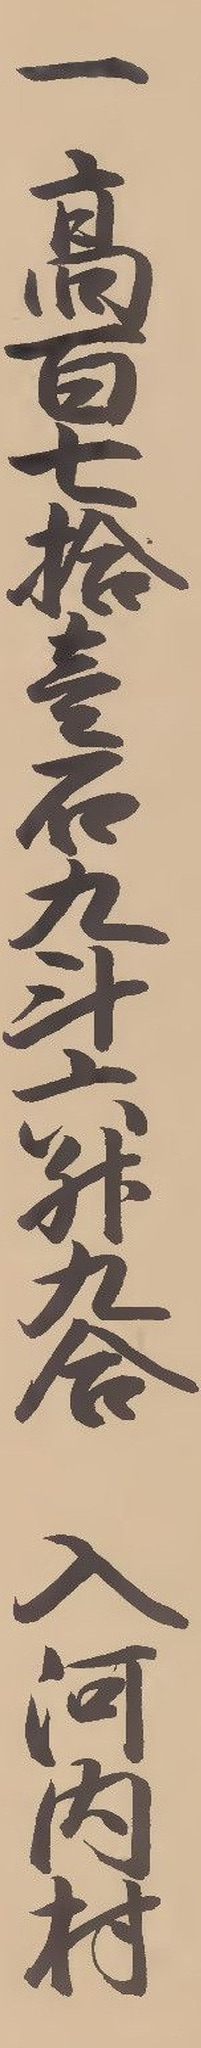一髙百七拾壱石九斗六升九合入河内村
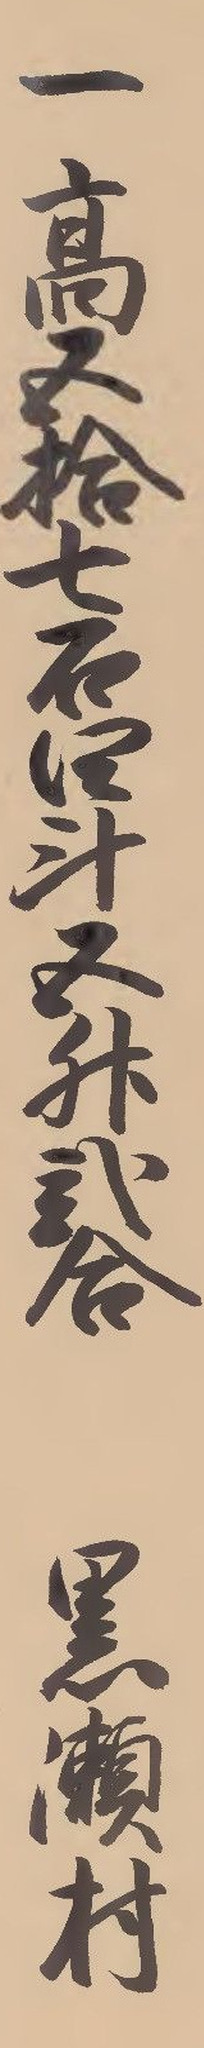一髙五拾七石四斗五升弐合黑瀬村
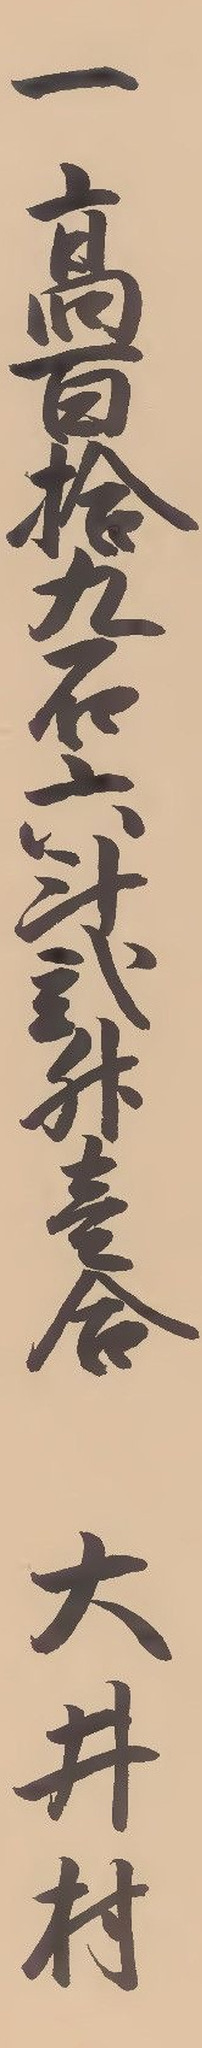一髙百拾九石六斗弐升壱合大井村
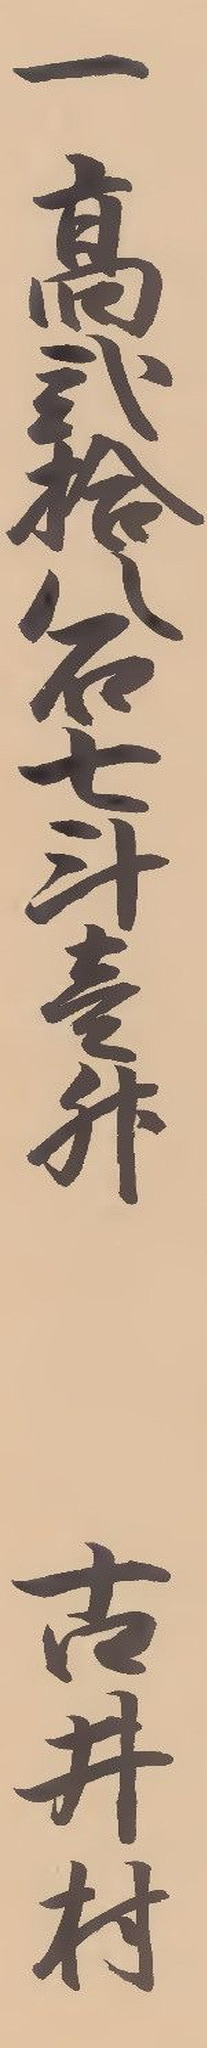一髙弐拾八石七斗壱升古井村

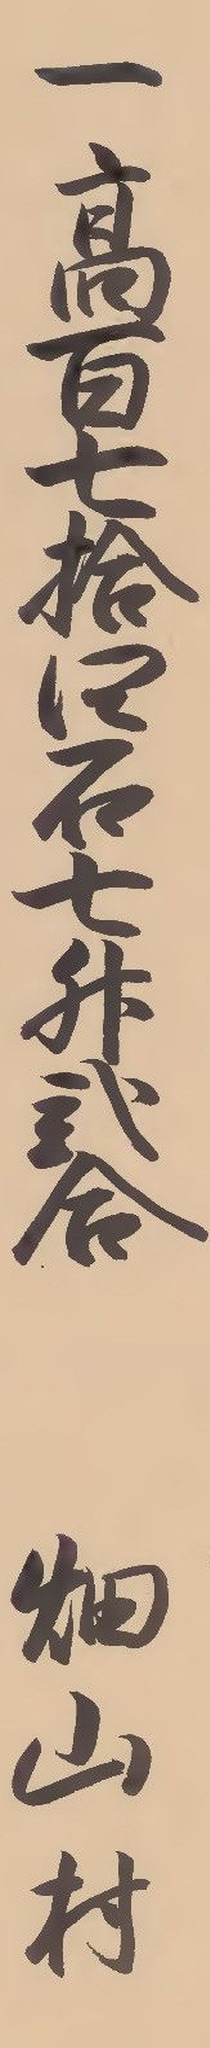一髙百七拾四石七升弐合畑山村
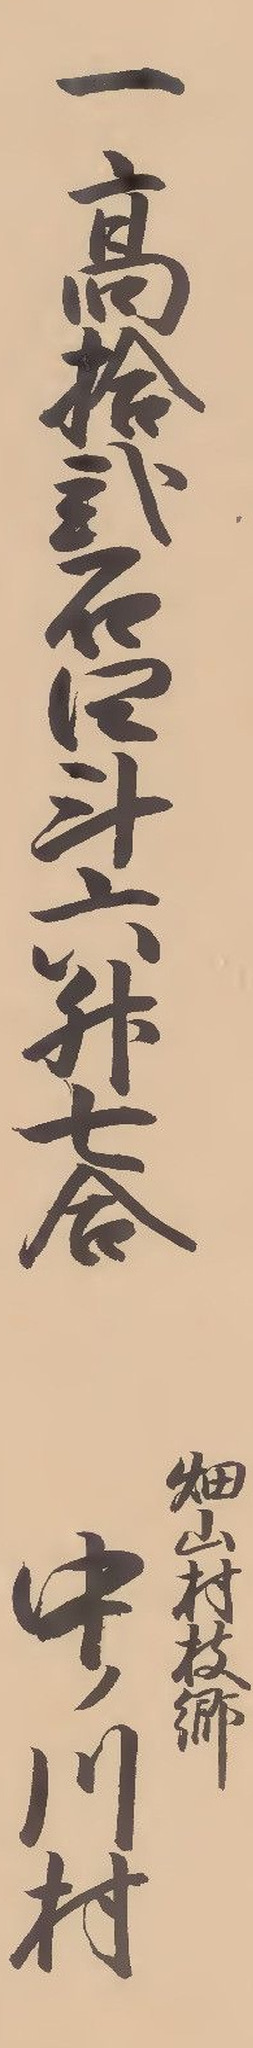一髙拾壱石四斗六升七合中ノ川村
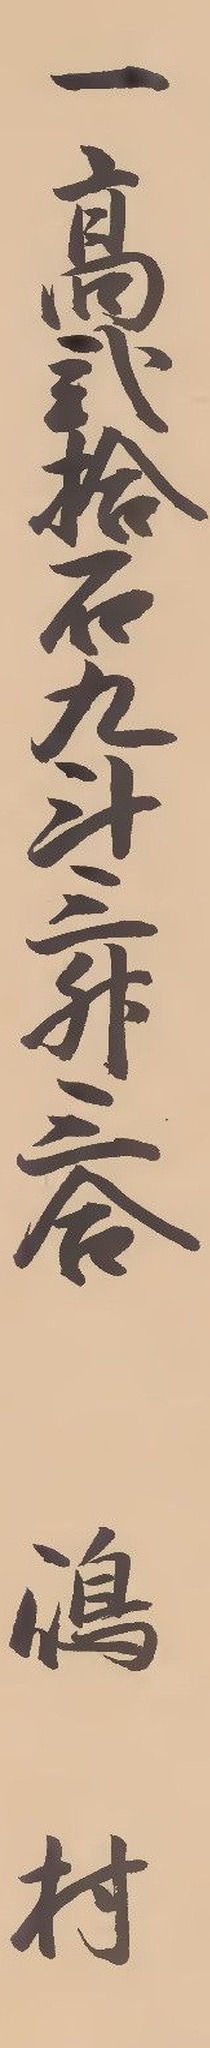一髙弐拾石九斗三升三合嶋村
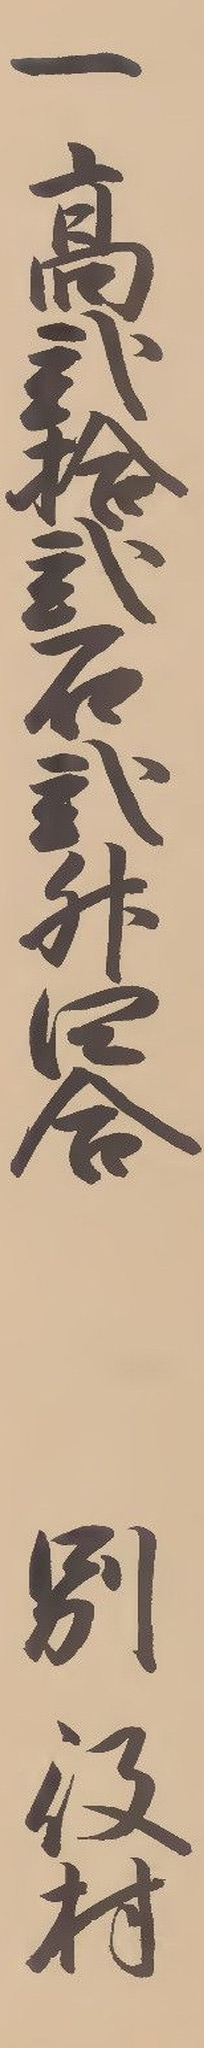一髙弐拾弐石弐升四合別役村
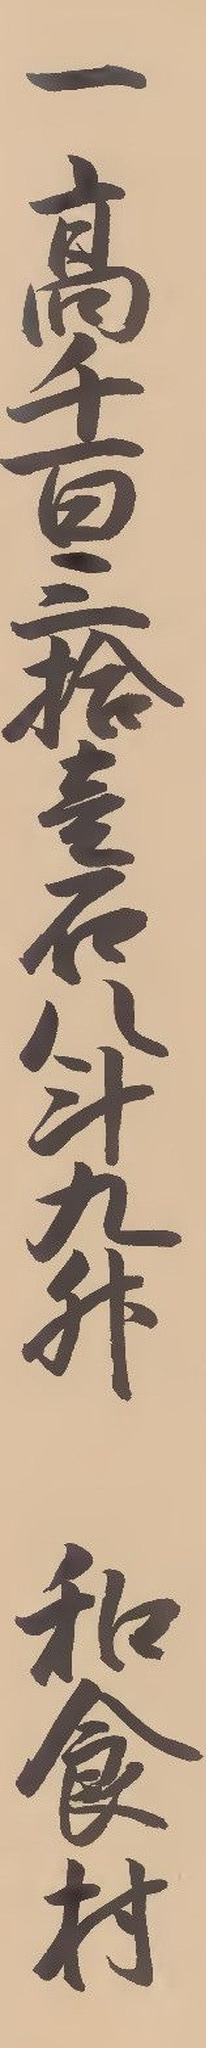一髙千百三拾壱石八斗九升和食村
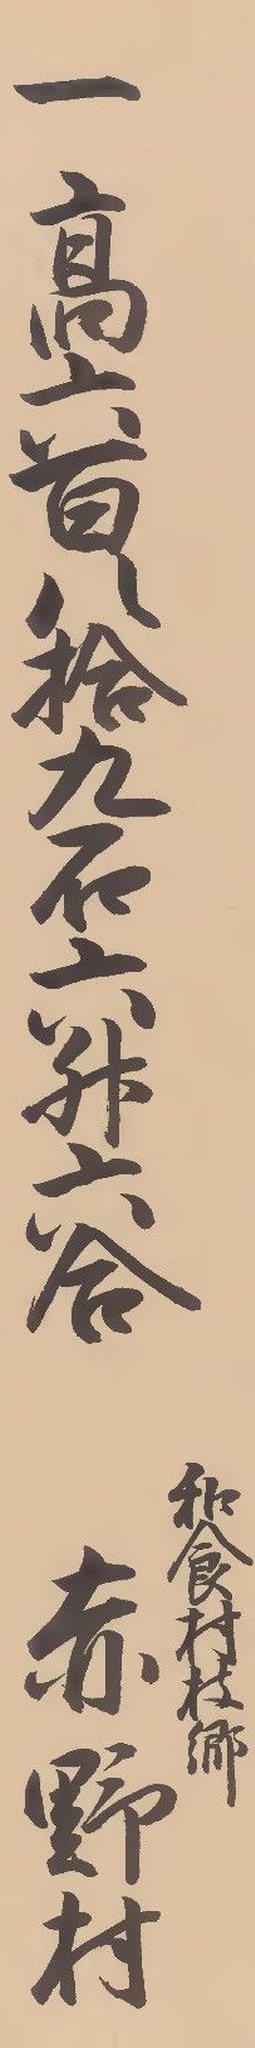一髙六百八拾九石六升六合赤野村
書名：土佐国郷帳
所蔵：国立公文書館 National Archives of Japan
